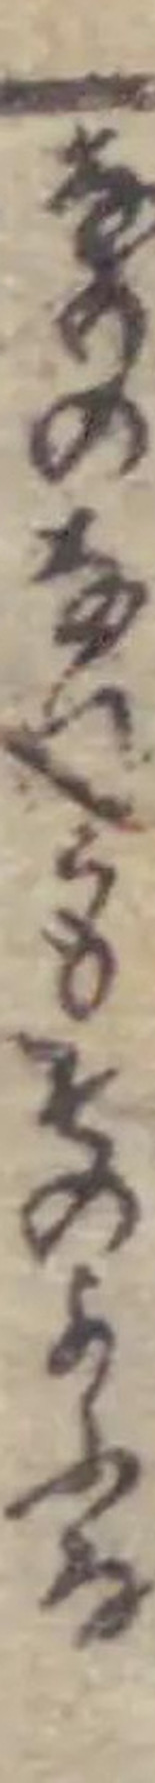なものなれともそのよふな
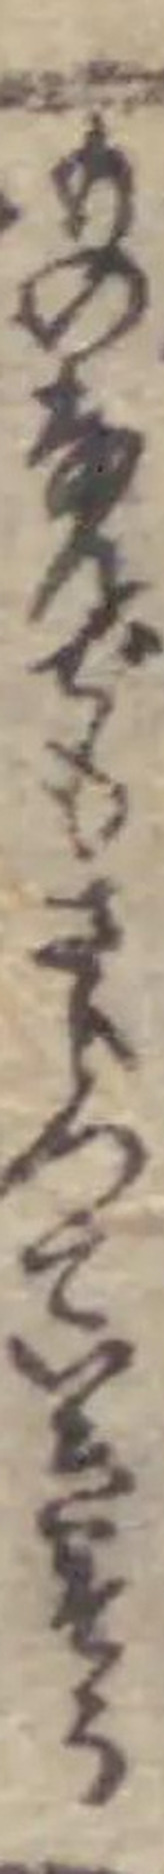ものなんでもさらつていきそう
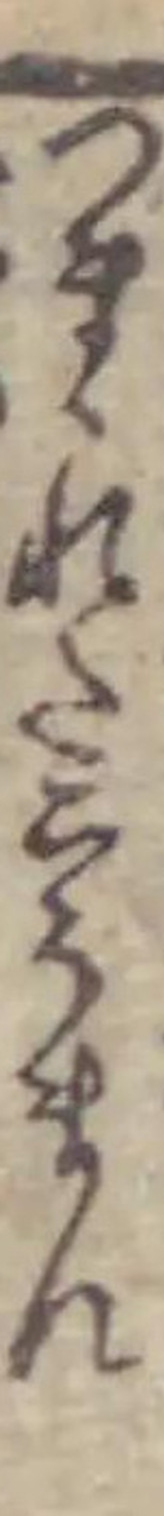つまゝれたこうまん
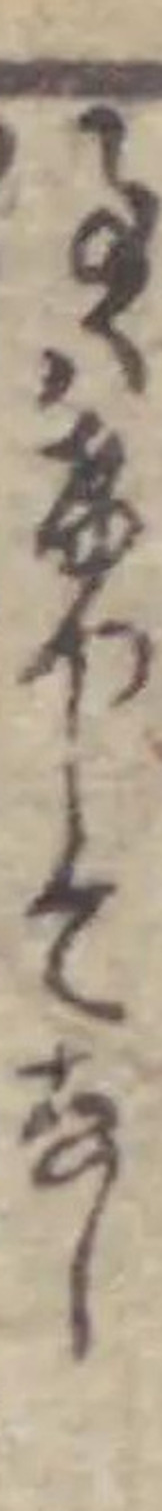事はけつしてなし
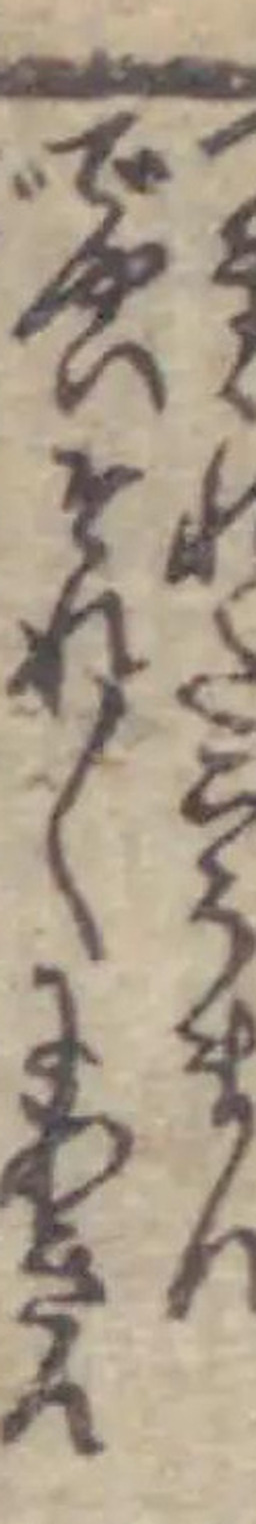でやいそれ〳〵にあきん
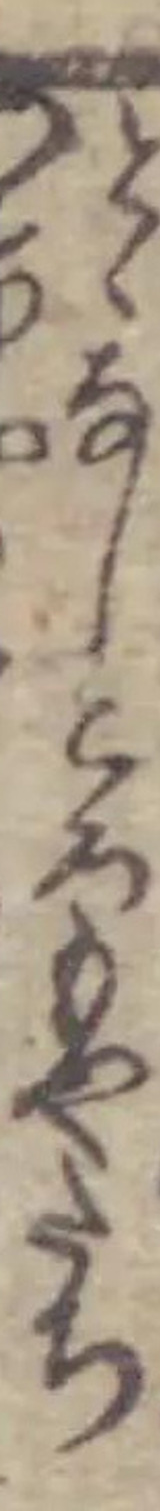どゝなしころもやたち
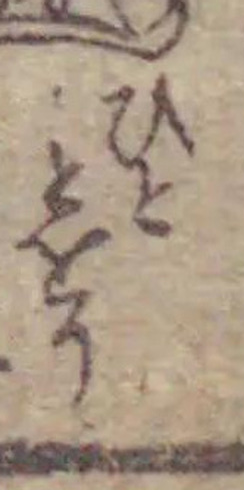とをり
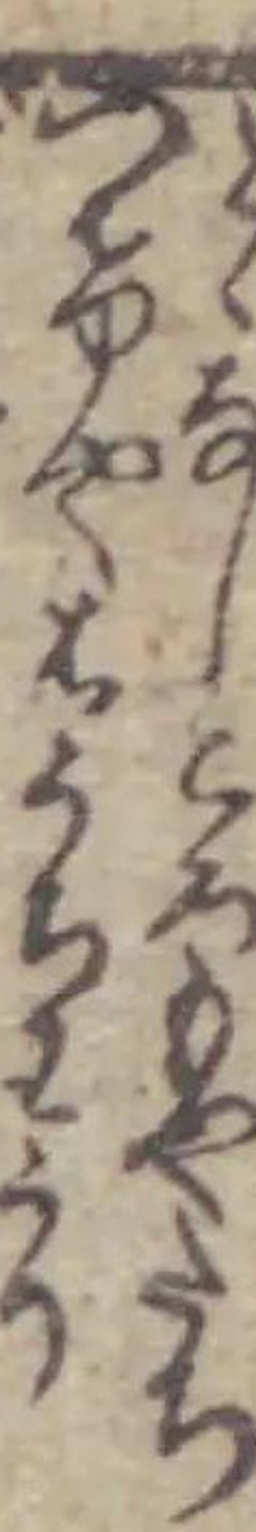つけやはうちわうり
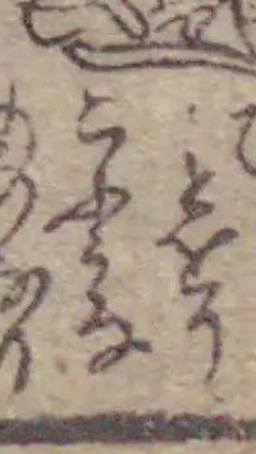こふかな
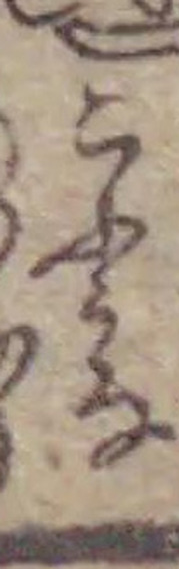こふかな
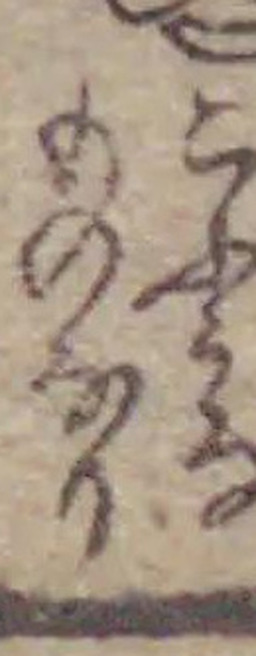ものなり
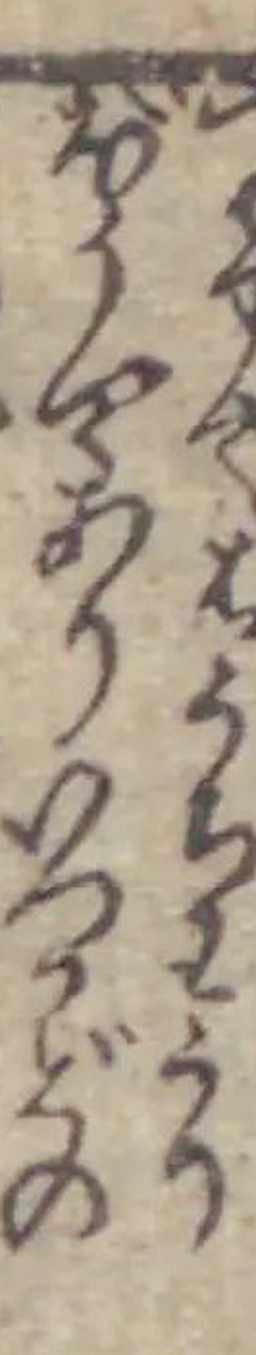ぼうやありいつかどの
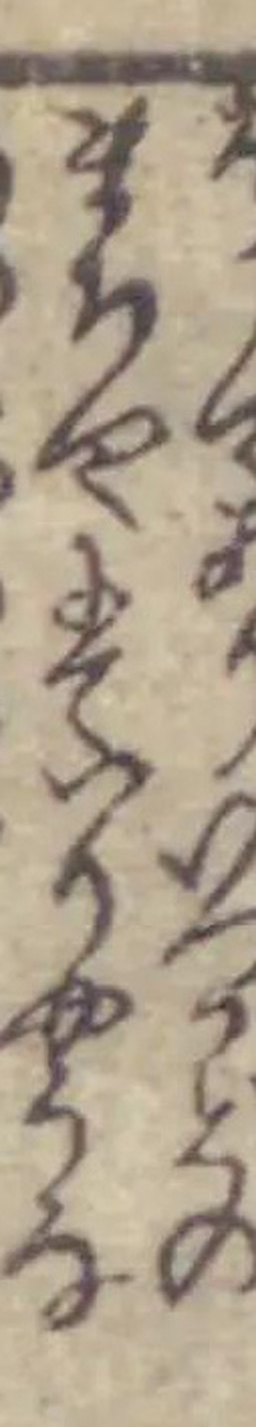まちやにていりやうな
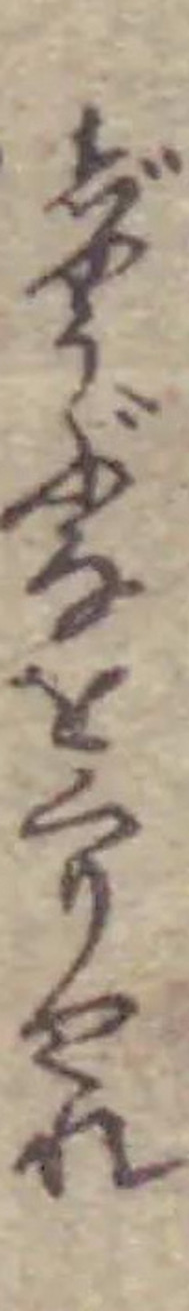じやうぶなをくりやれ
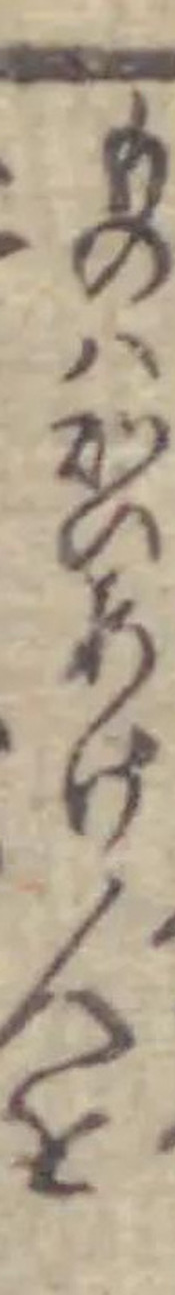ものはかいあけ人を
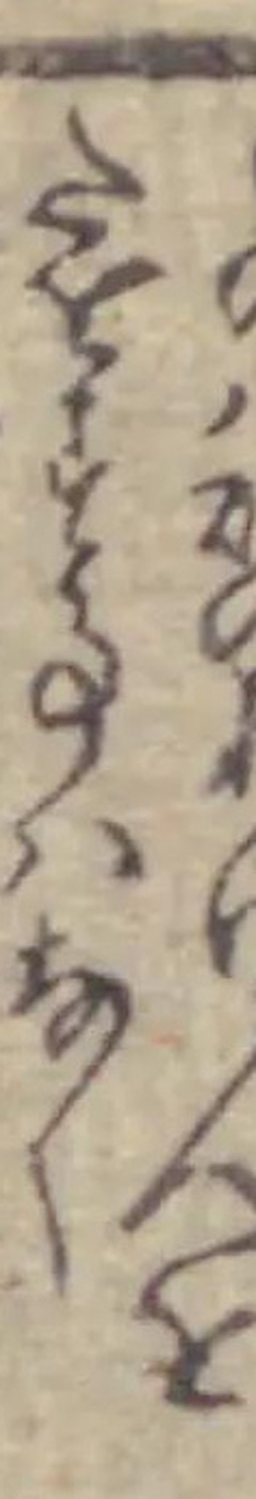たをす事はなく
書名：珍説女天狗 2巻
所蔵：国立国会図書館 National Diet Library, JAPAN
